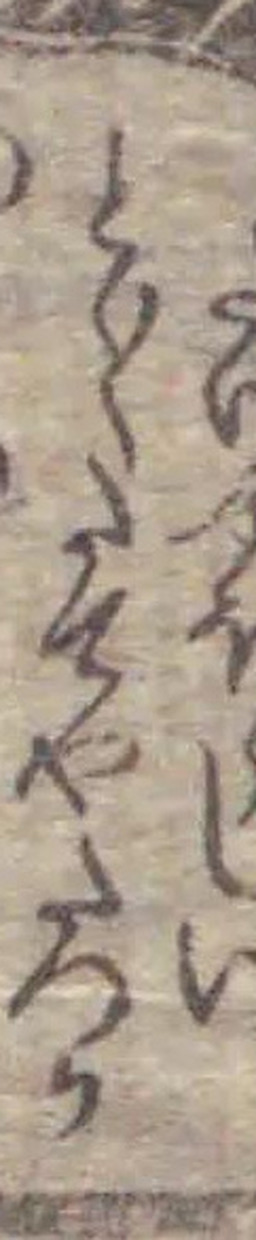とく〳〵たてやたつか
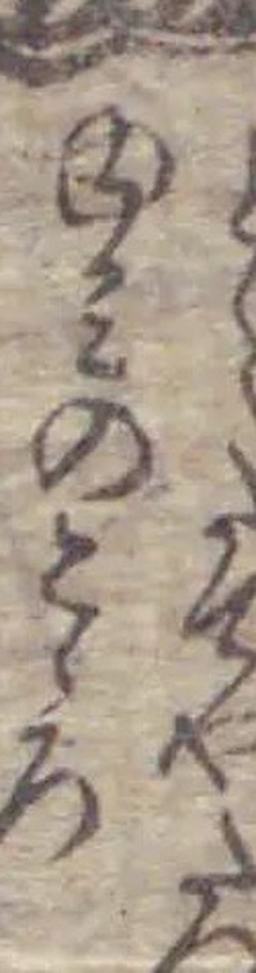ゆみのこゝろ
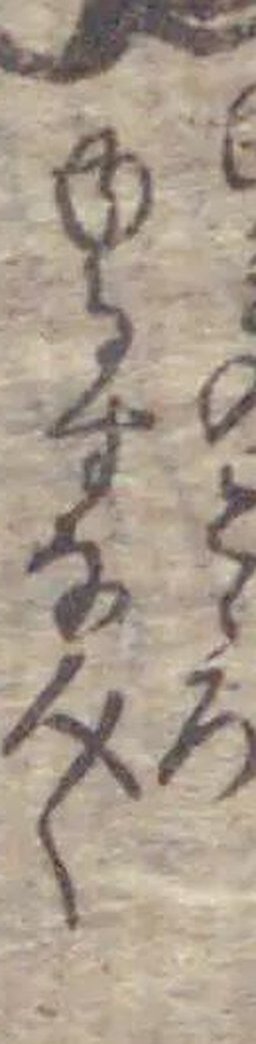ゆるすな人〳〵
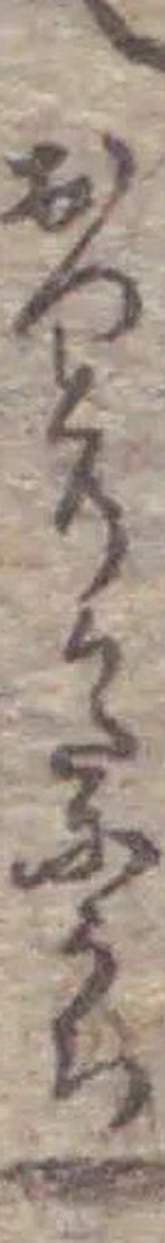おつとりかたにうち
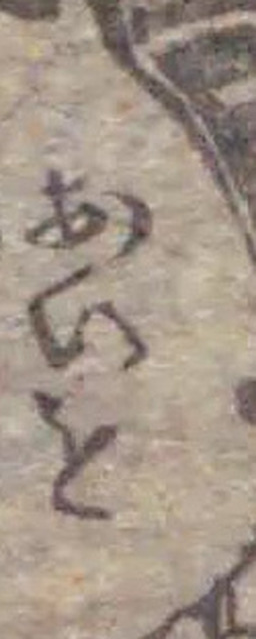おいを
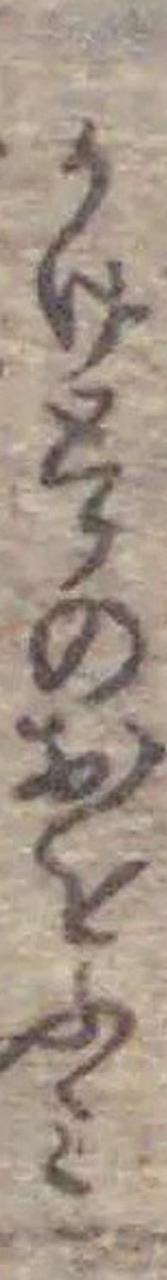かけとらのおをふみ
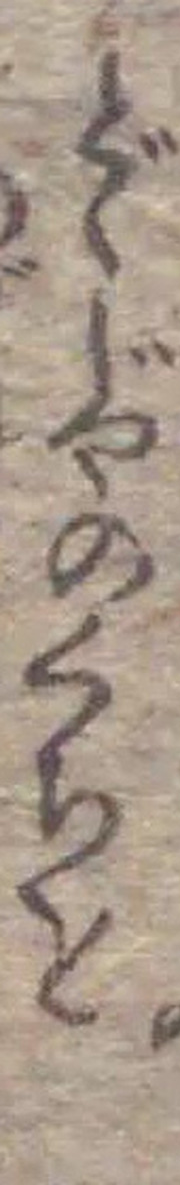どくじやのくちを
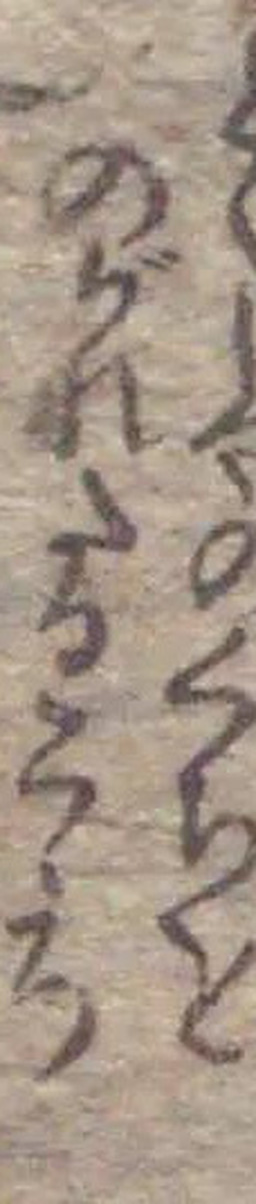のがれたるこゝろ
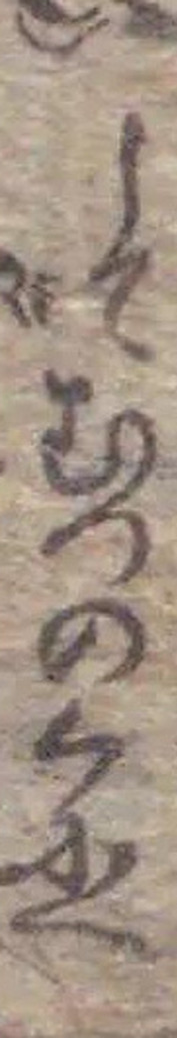してむつのくにへ
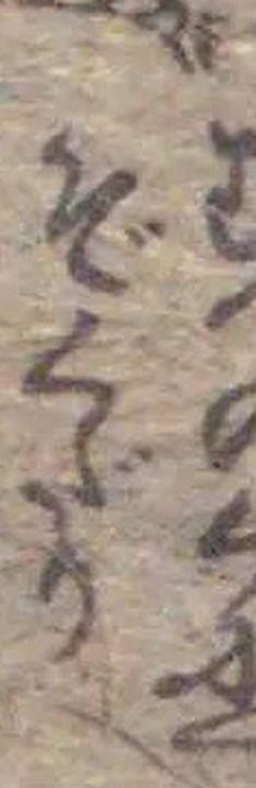ぞくだり

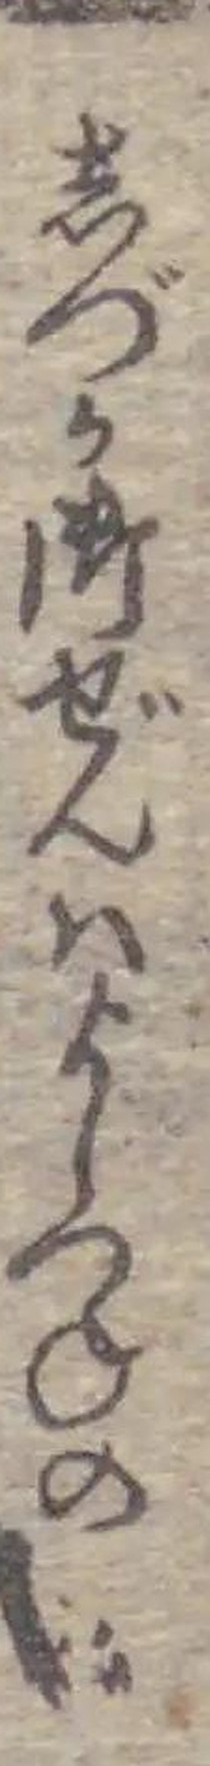しづか御ぜんはよしつねの
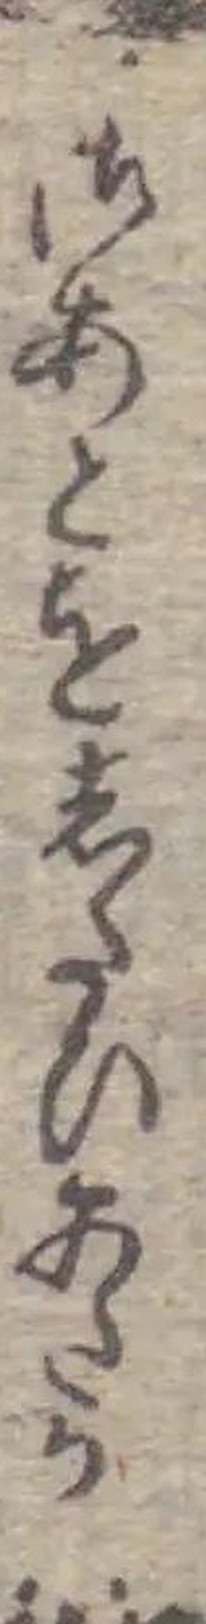御あとをしたひあたか
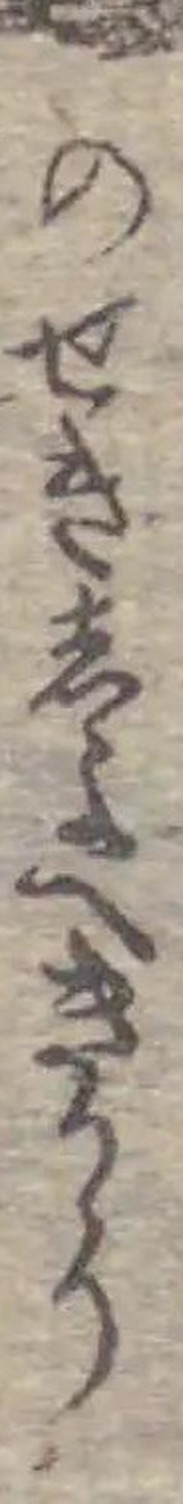のせきしよへきかゝり
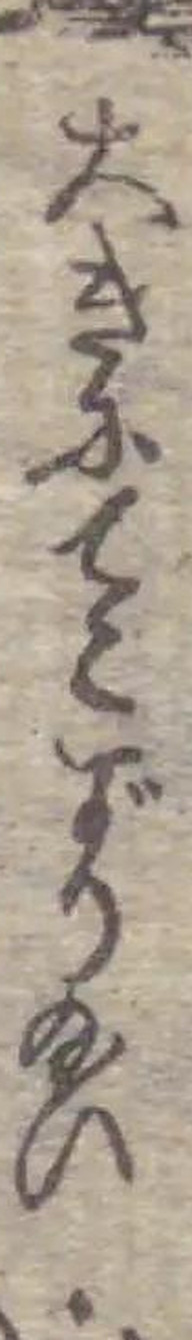大きにてこずり給ひ
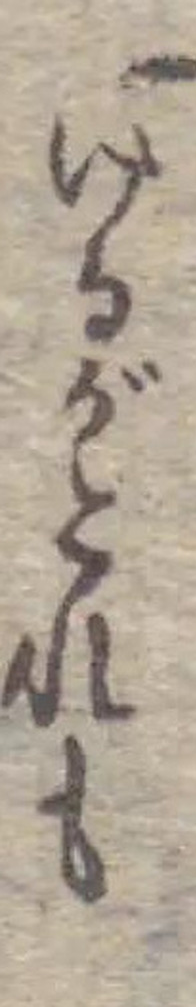けるがこれも
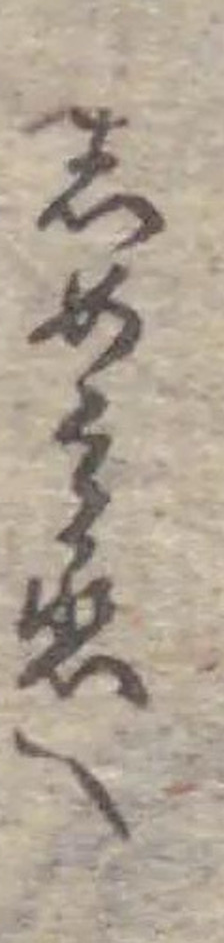しめ之丞へ
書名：通増安宅関 2巻
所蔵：国立国会図書館 National Diet Library, JAPAN
